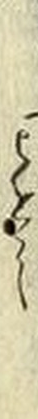被進之
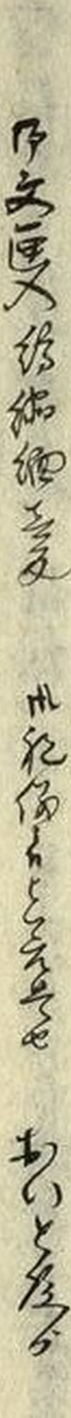御文匣入縞縮緬壱反御祝儀ニ付被差上候由おいと殿ゟ
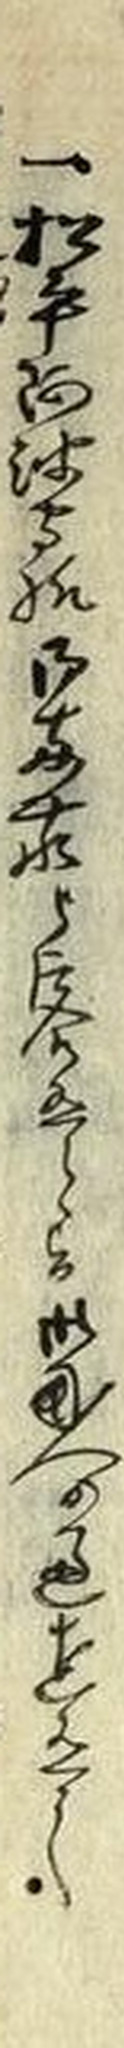一松平阿波守様御両敬被仰合有之候旨御用人ゟ通達有之
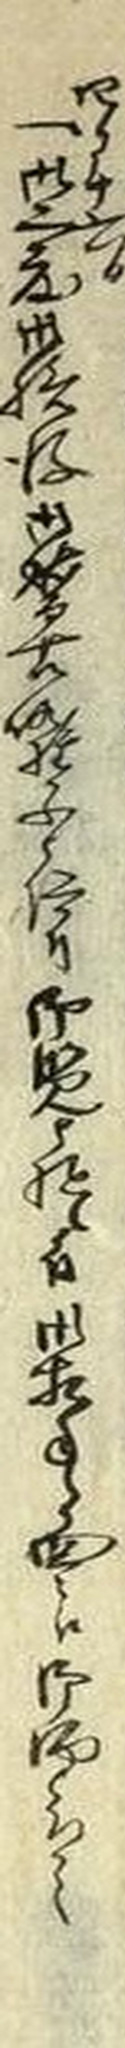一四月十六日御二度御膳後御稽古囃子被仰付御覧被遊候ニ付御相手之面々江御酒被下之
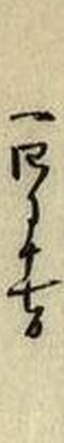一四月廿一日
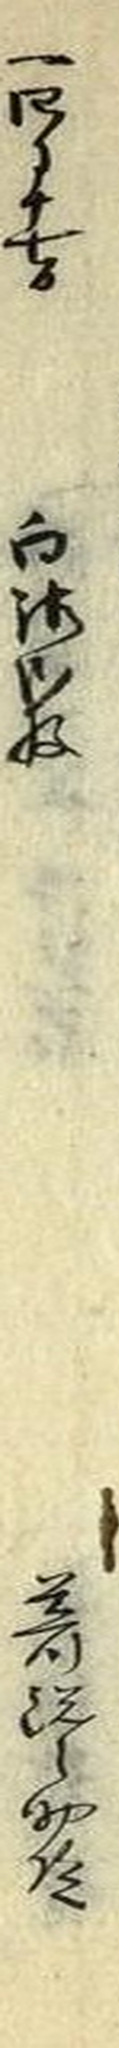一四月十七日白銀弐枚荒川鋭之助殿
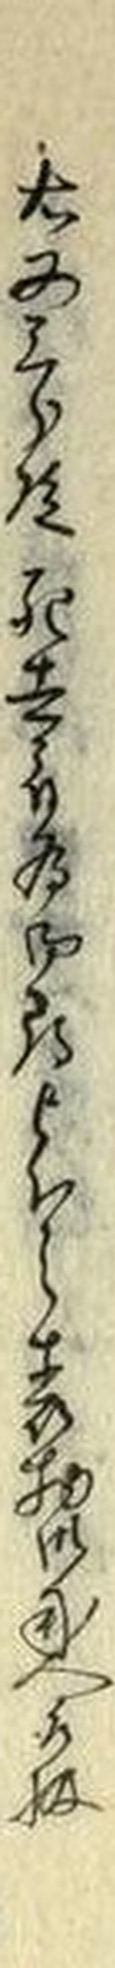右又三郎殿死去ニ付為御尋被下之表物御用人取扱
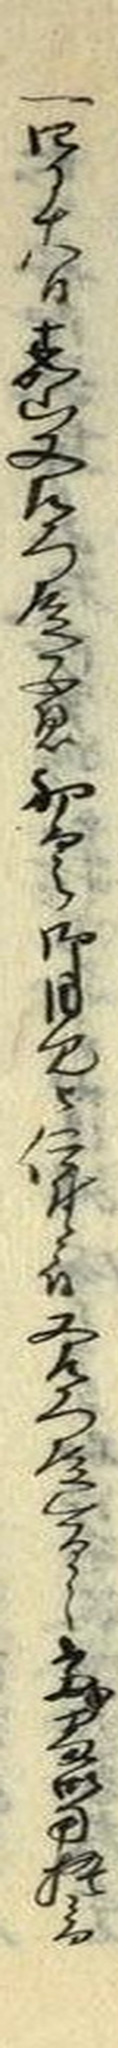一四月十八日森山又左衛門殿子息初而之御目見被仰付候ニ付又左衛門殿今日之当番御用捨ニ而
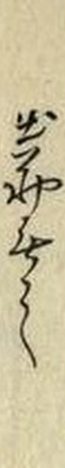出勤無之
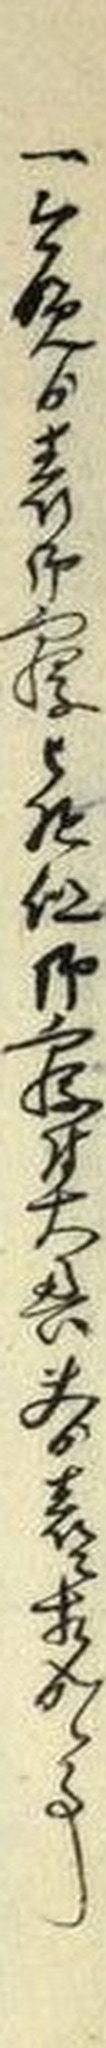一今晩ゟ表御寝被遊但御寝付大奥夫ゟ表ニ相成候事
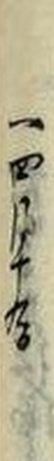一四月廿一日
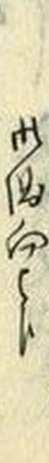御側向被下
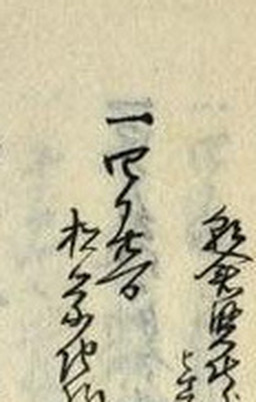一四月廿一日
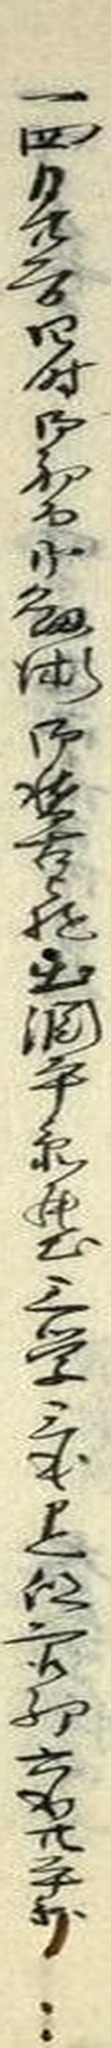一四月廿二日四時御初而御剣術御稽古被遊出淵平兵衛罷出三学三本申上但最初六本共平兵衛
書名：少傅日録抄（斉善付側向頭取日記、在府）
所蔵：福井県文書館 Fukui Prefectural Archives
